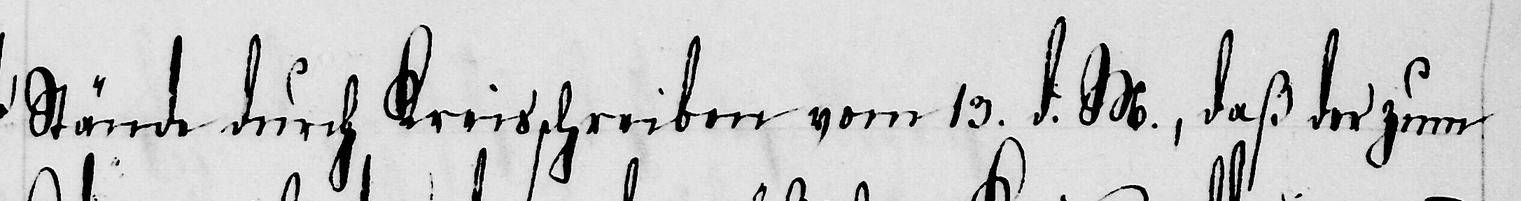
Stände durch Kreisschreiben vom 13. d. M., daß der zum
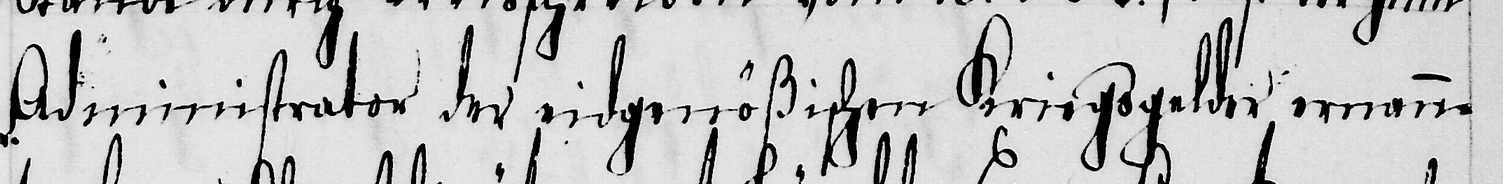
Administrator der eidgenößischen Kriegsgelder ernann¬
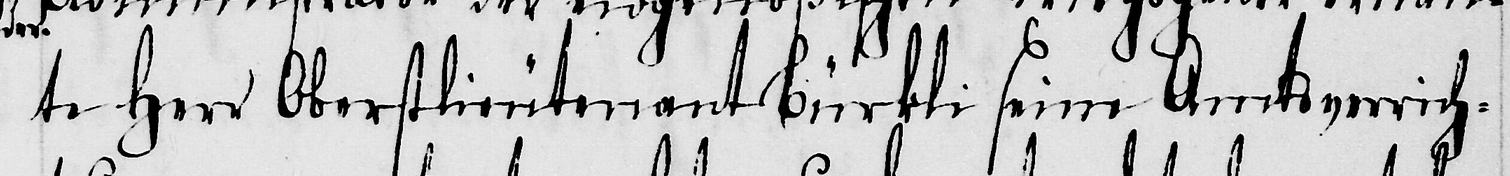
te Herr Oberstlieutenant Bürkli seine Amtsverrich¬
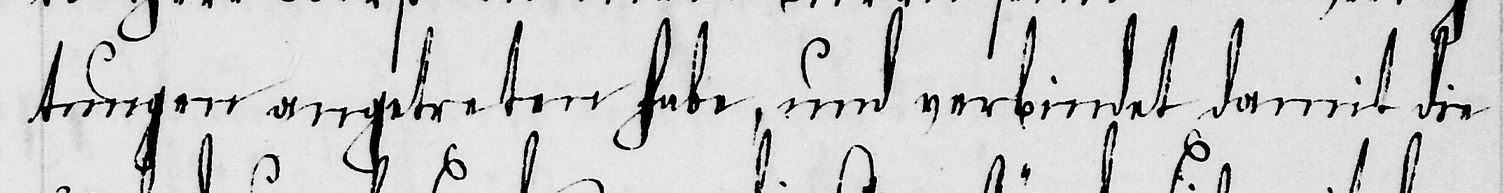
tungen angetreten habe, und verbindet damit die
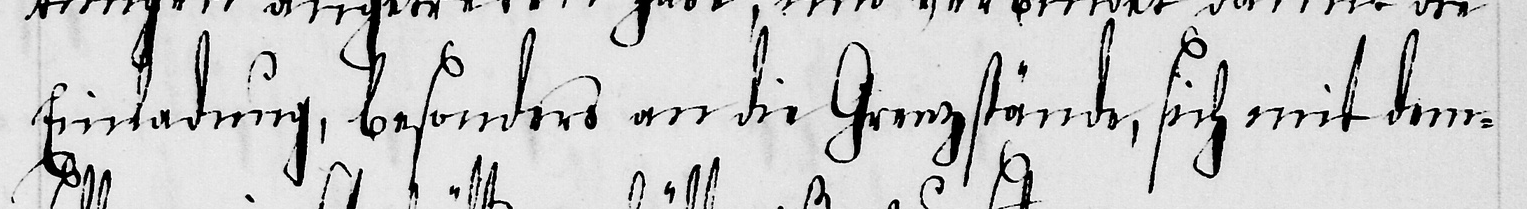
Einladung, besonders an die Grenzstände, sich mit dem
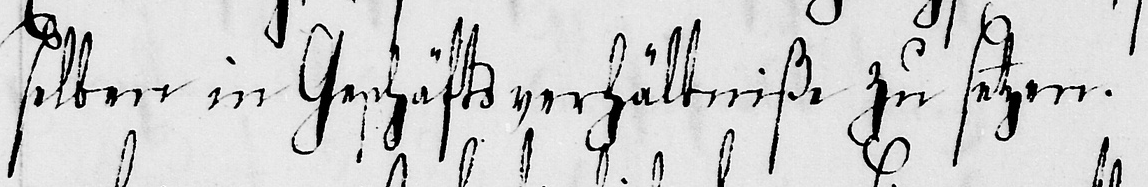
selben in Geschäftsverhältniße zu setzen.
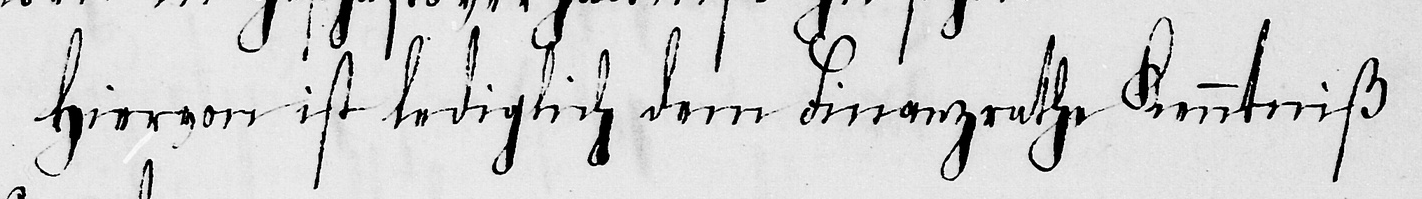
Hiervon ist lediglich dem Finanzrathe Kenntniß
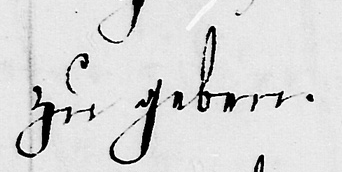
zu geben.
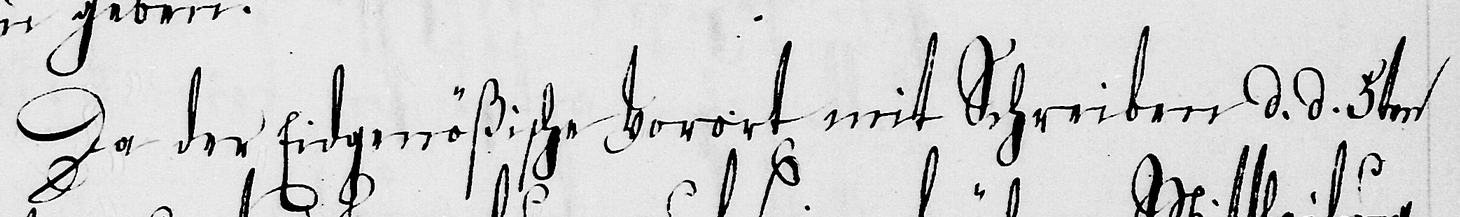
Da der Eidgenößische Vorort mit Schreiben d. d. 5ten
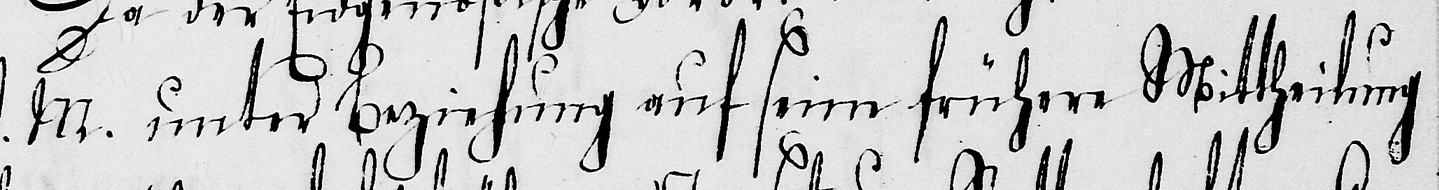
M. unter Beziehung auf seine frühere Mittheilung
